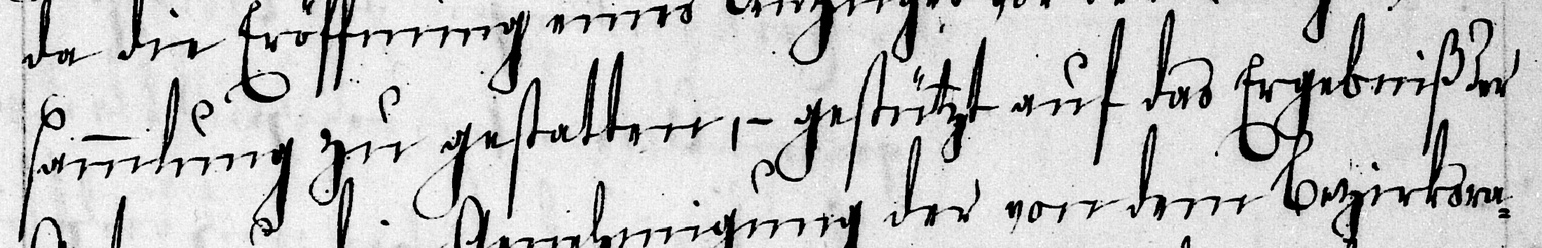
sammlung zu gestatten, – gestützt auf das Ergebniß der
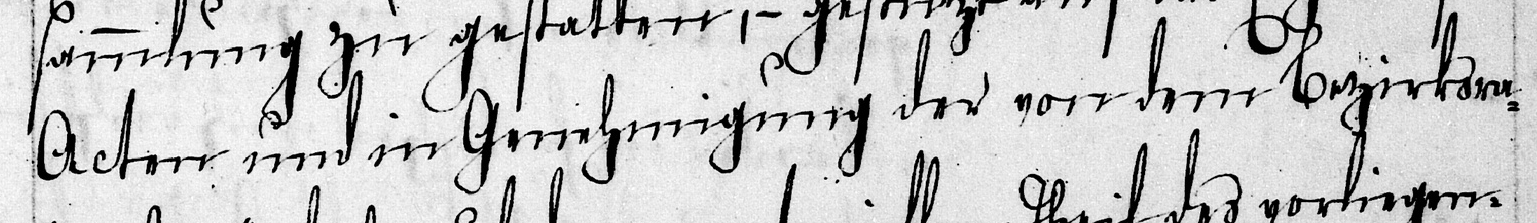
Acten und in Genehmigung der von dem Bezirksra¬
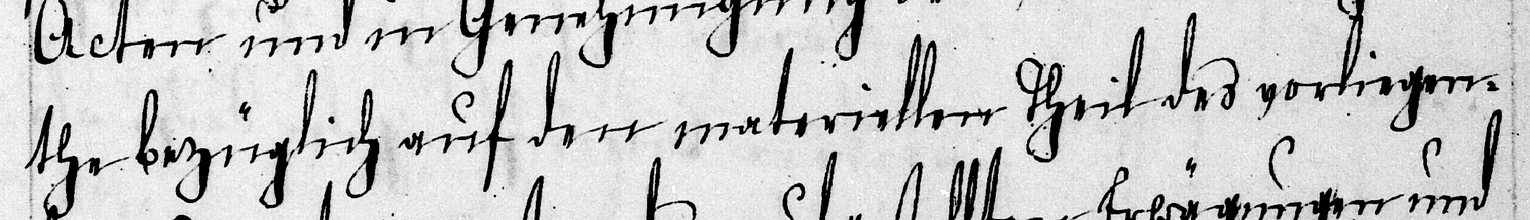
the bezüglich auf den materiellen Theil des vorliegen¬
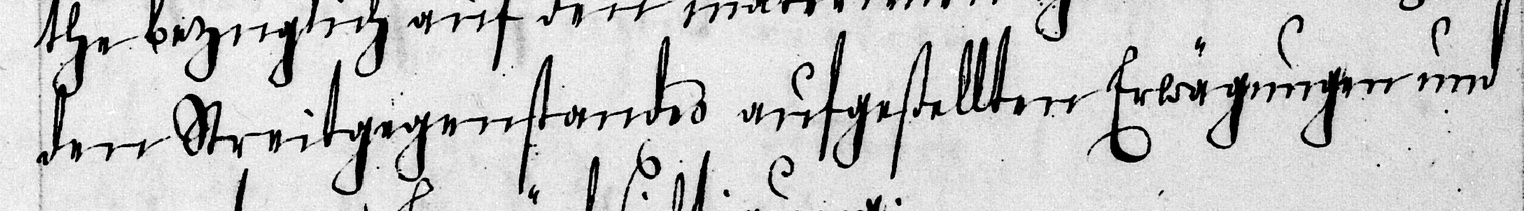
den Streitgegenstandes aufgestellten Erwägungen und
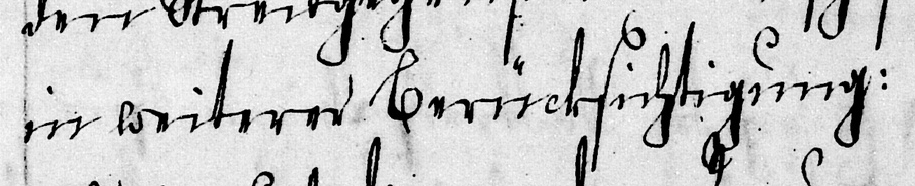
in weiterer Berücksichtigung:
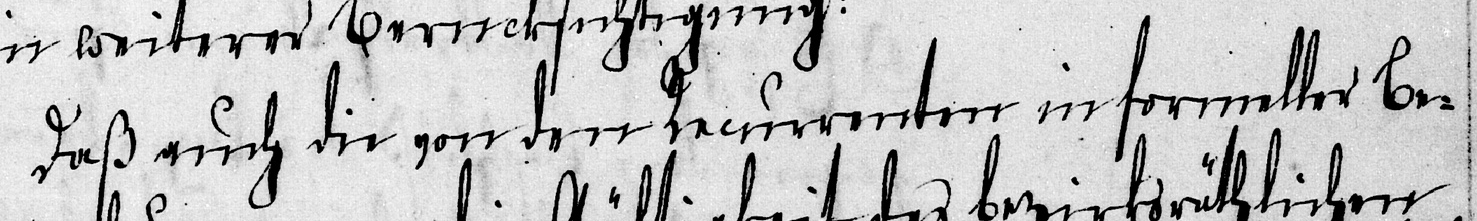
Daß auch die von dem Recurrenten in formeller Be¬
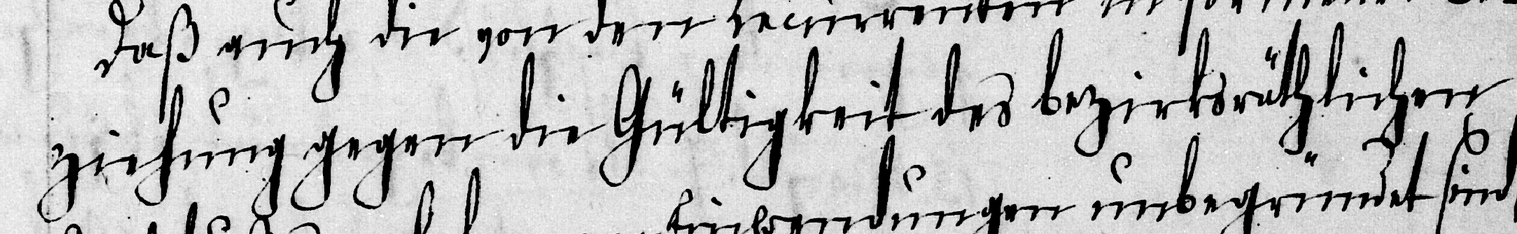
ziehung gegen die Gültigkeit des bezirksräthlichen
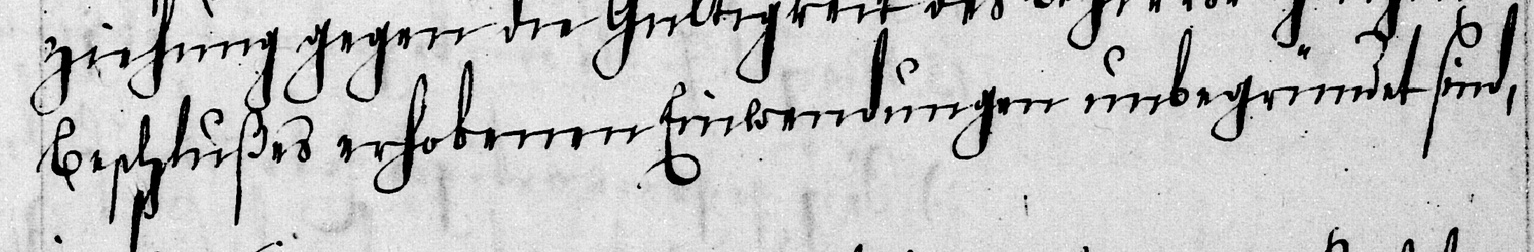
Beschlußes erhobenen Einwendungen unbegründet sind,
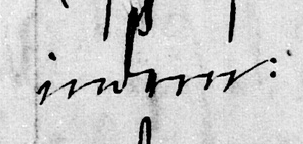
indem:
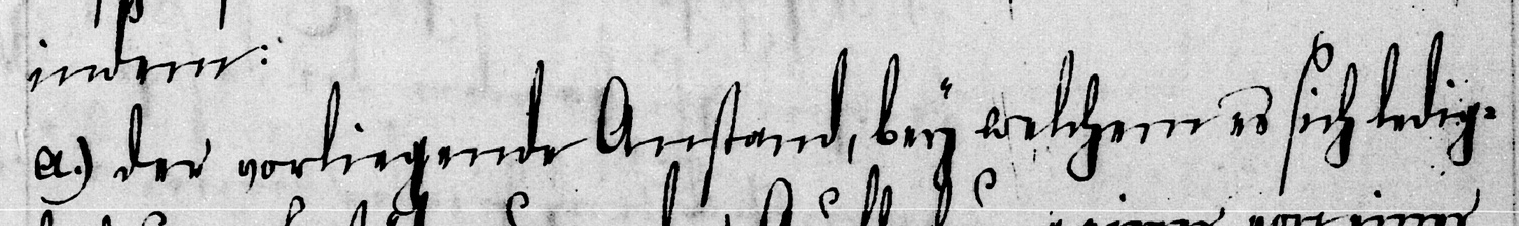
a.) der vorliegende Anstand, bey welchem es sich ledig¬
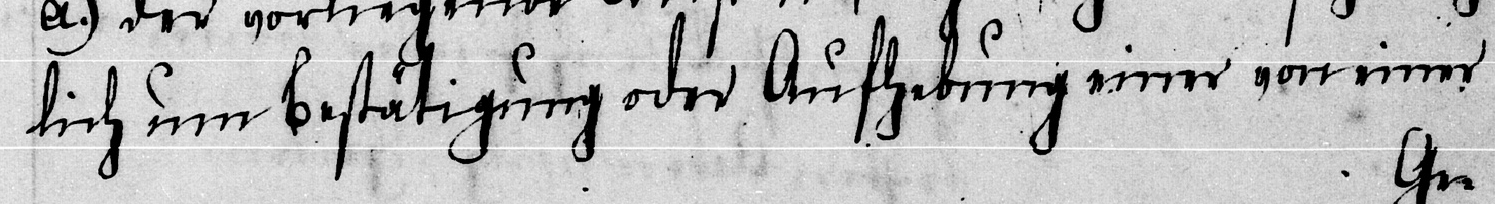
lich um Bestätigung oder Aufhebung einer von einer
